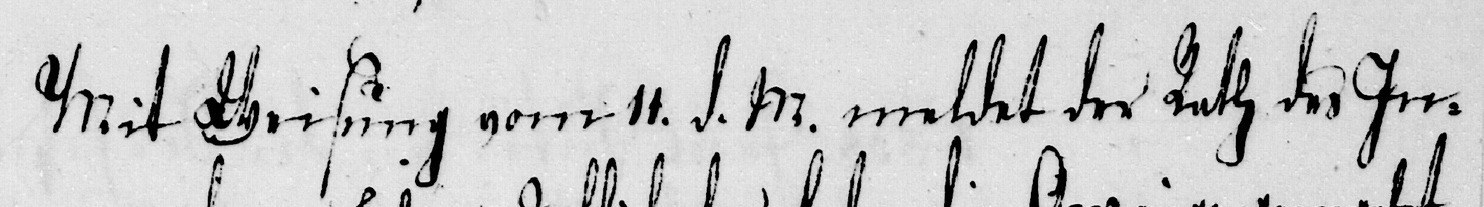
Mit Weisung vom 11. d. M. meldet der Rath des In¬
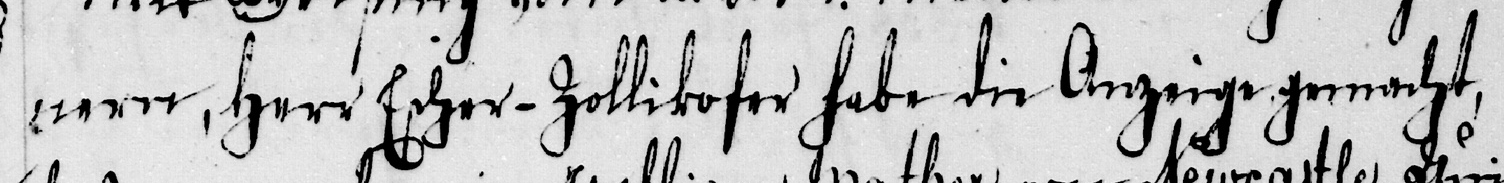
nern, Herr Escher-Zollikofer habe die Anzeige gemacht,
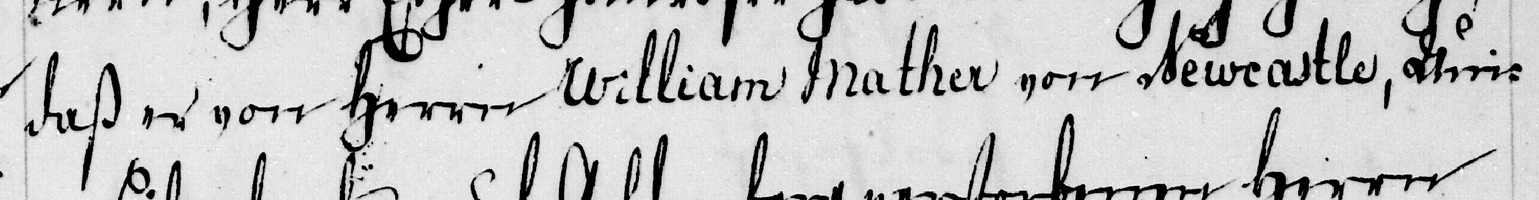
daß er von Herrn William Mather von Newcastle, Uni¬
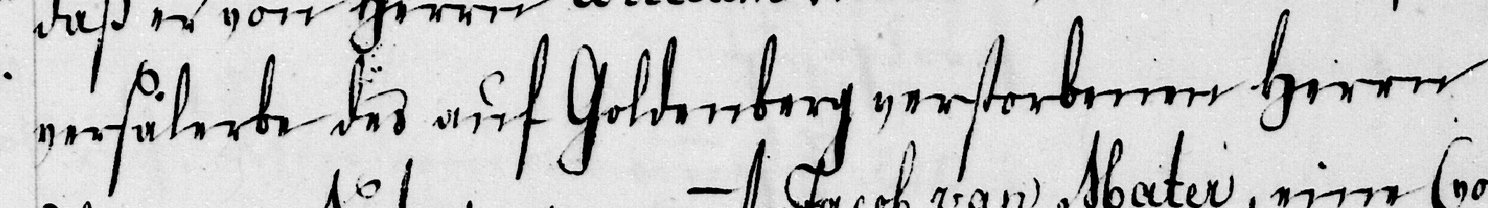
versalerbe des auf Goldenberg verstorbenen Herrn
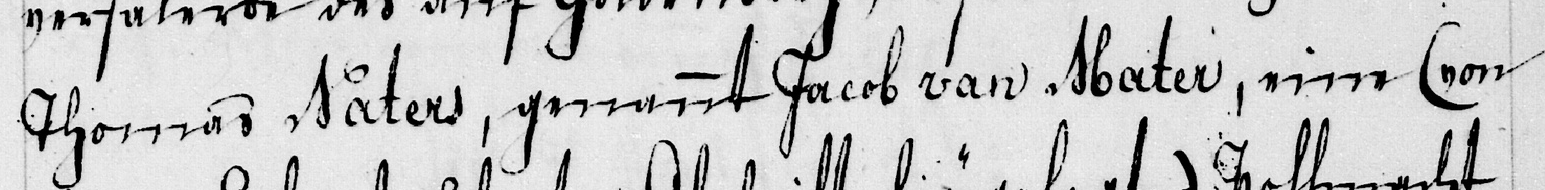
Thomas Naters, genannt Jacob van Mater, eine (von
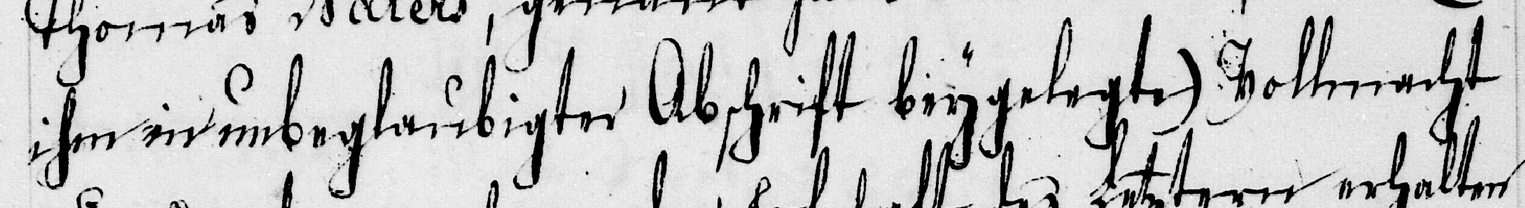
ihm in unbeglaubigter Abschrift beygelegte) Vollmacht
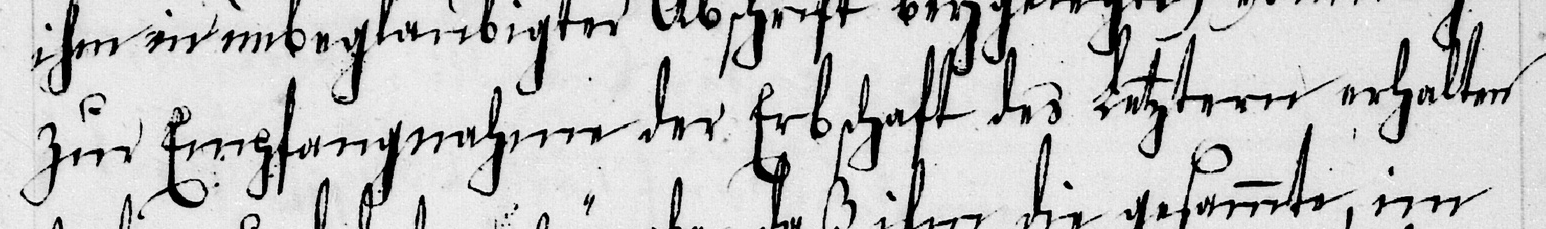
zur Empfangnahme der Erbschaft des Letztern erhalten
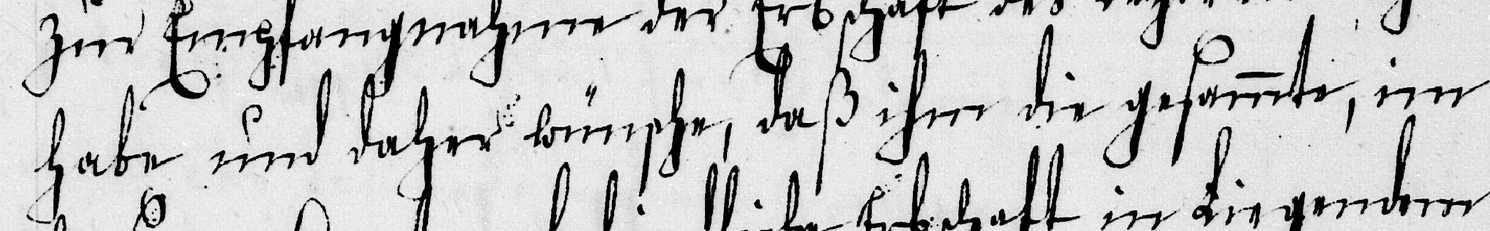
habe und daher wünsche, daß ihm die gesammte, im
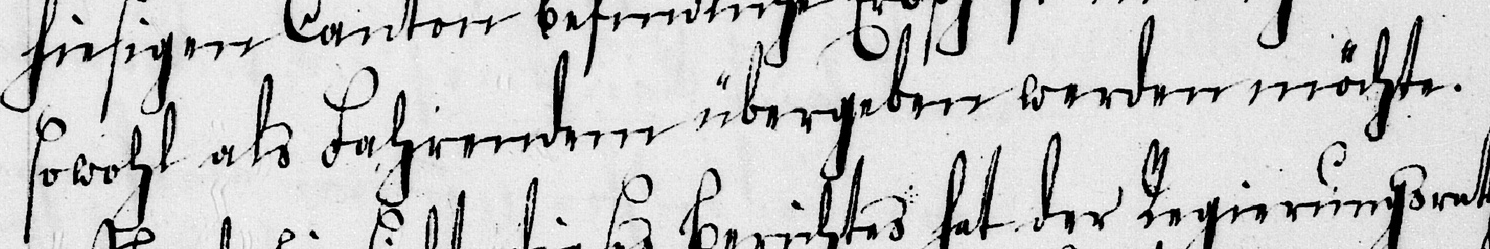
sowohl als Fahrendem übergeben werden möchte.
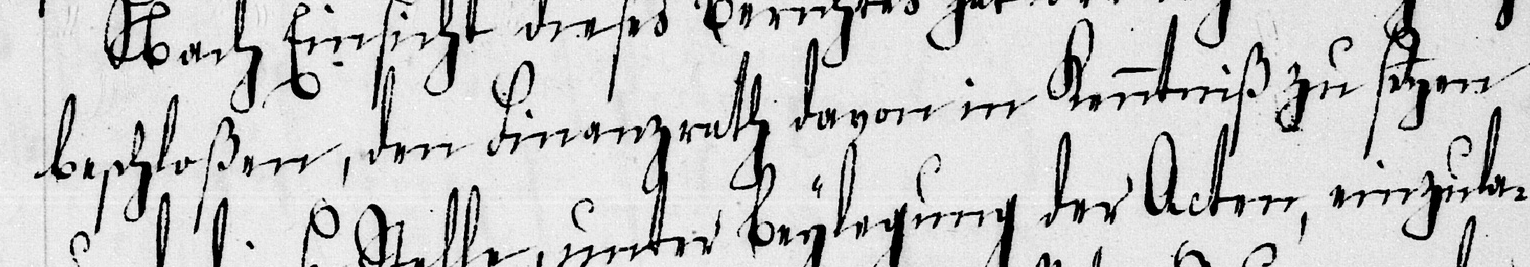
beschloßen, den Finanzrath davon in Kenntniß zu setzen
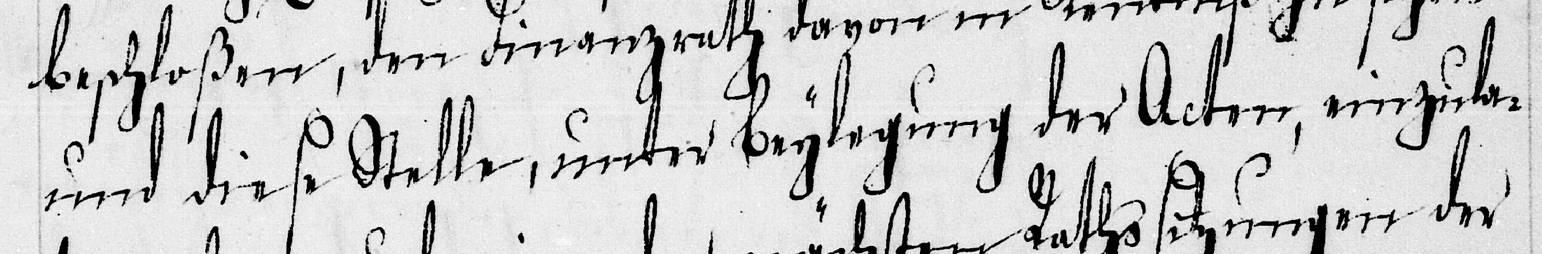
und diese Stelle, unter Beylegung der Acten, einzula¬
